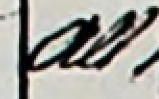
Alt
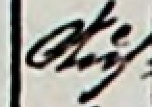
Aus
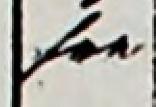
see
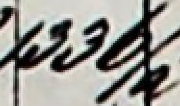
1336/a
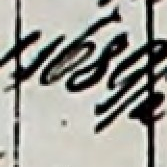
1689/a
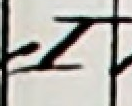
I
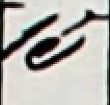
15
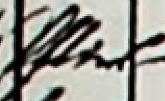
Pflinds
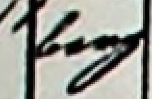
berg
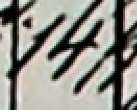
14
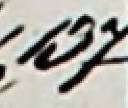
137
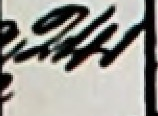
241
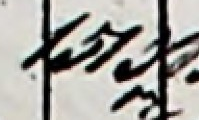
151
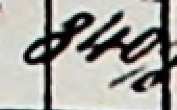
840,0
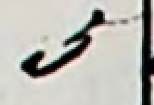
5
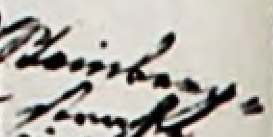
Steinberg„
